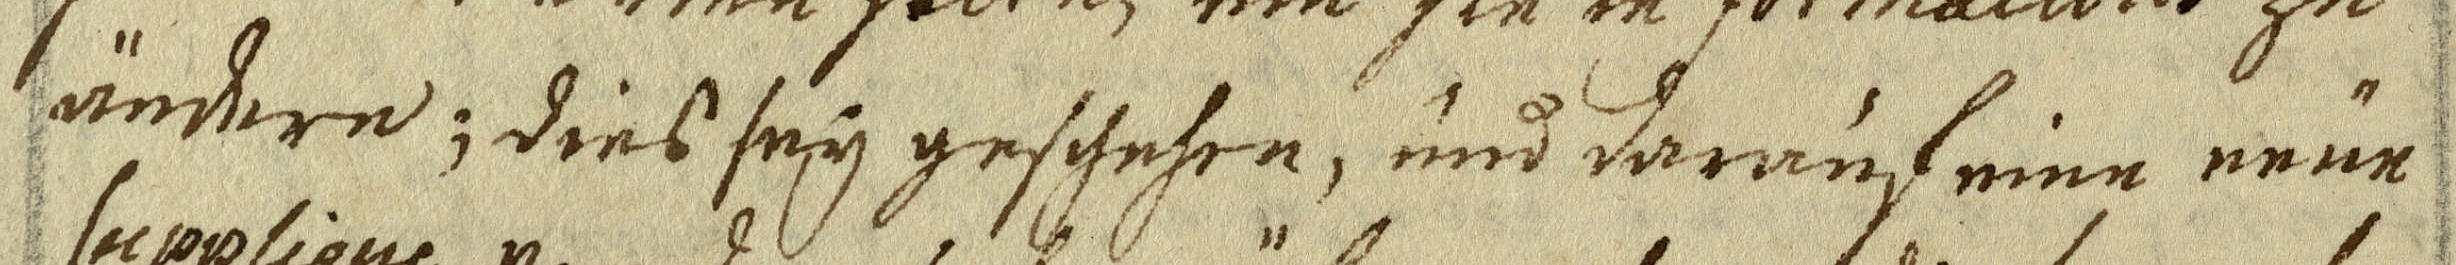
ändern; dies seÿ geschehen, und darauf eine neue
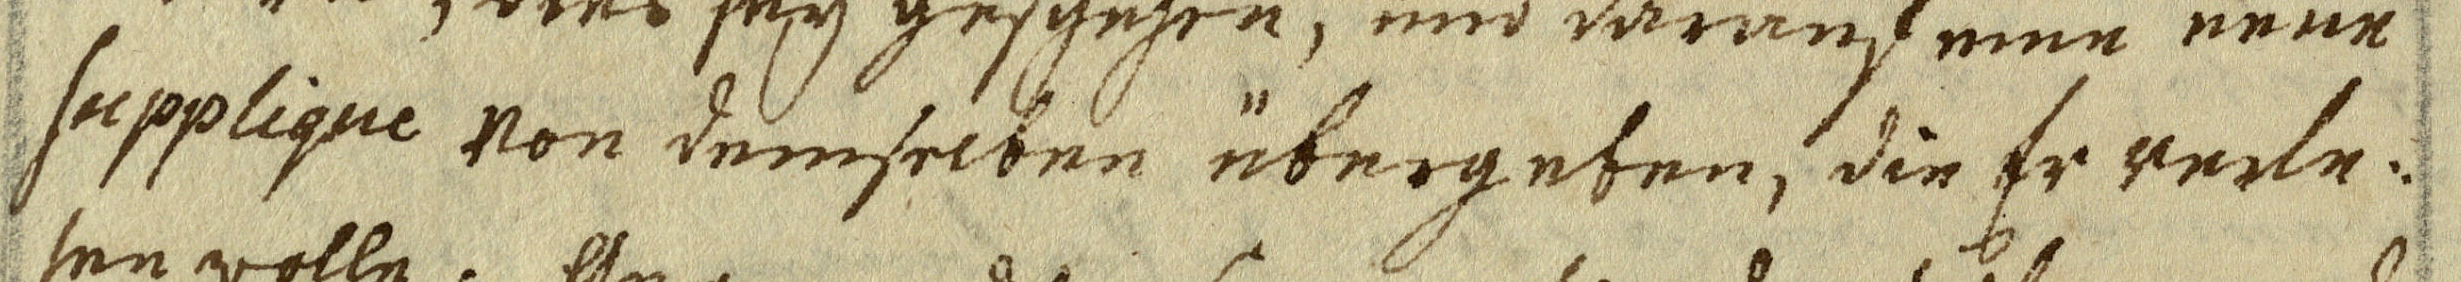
Supplique von demselben übergeben, die Er verle¬
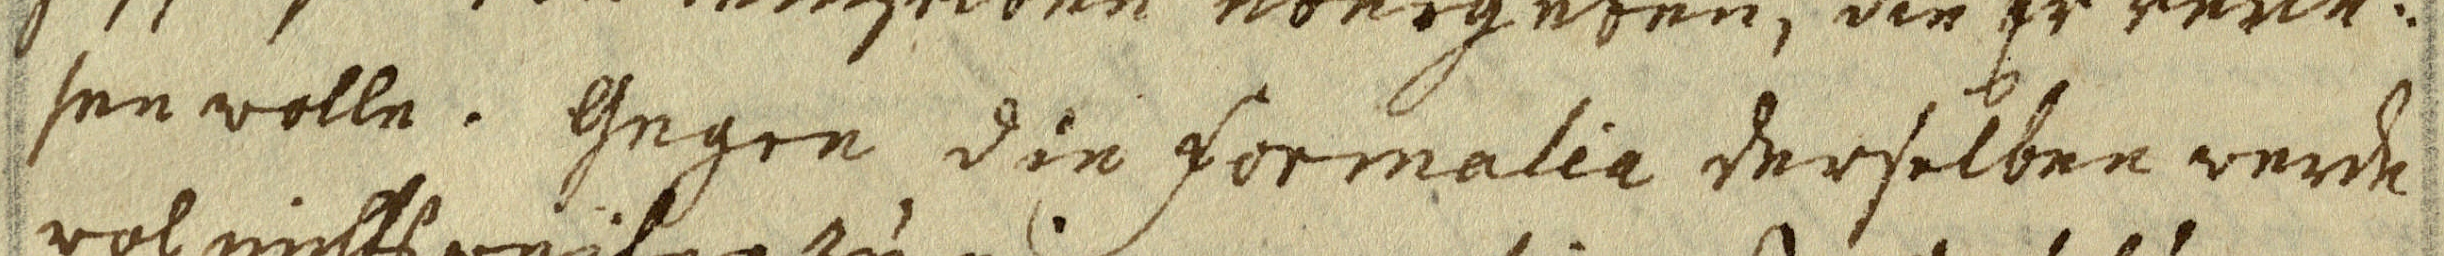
sen wolle. Gegen die Formalia derselben werde
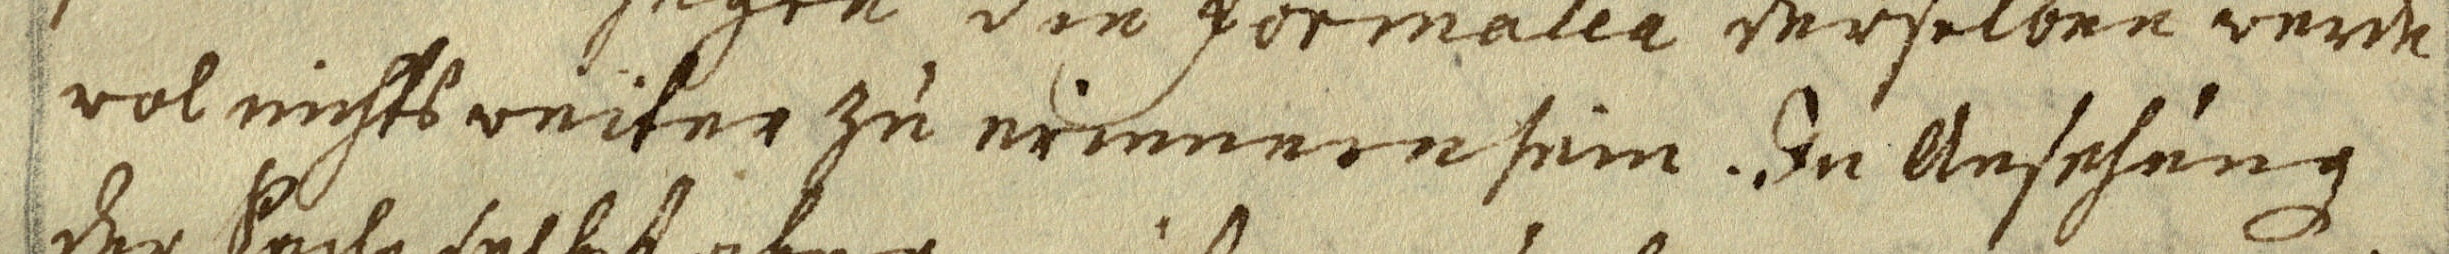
wol nichts weiter zu erinnern sein. In Ansehung
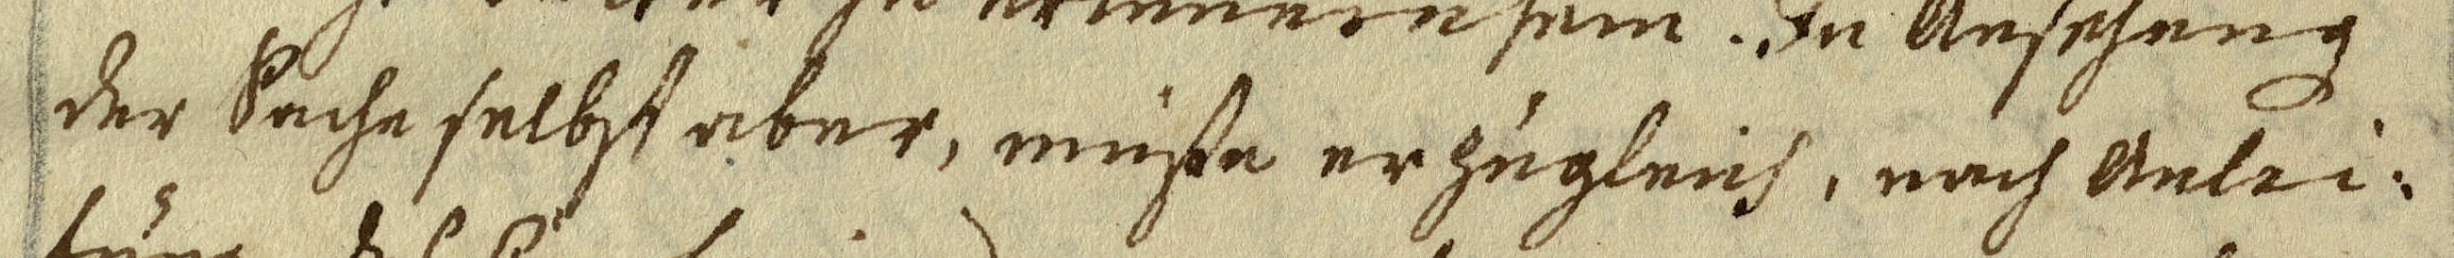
der Sache selbst aber, müße er zugleich, nach Anlei¬
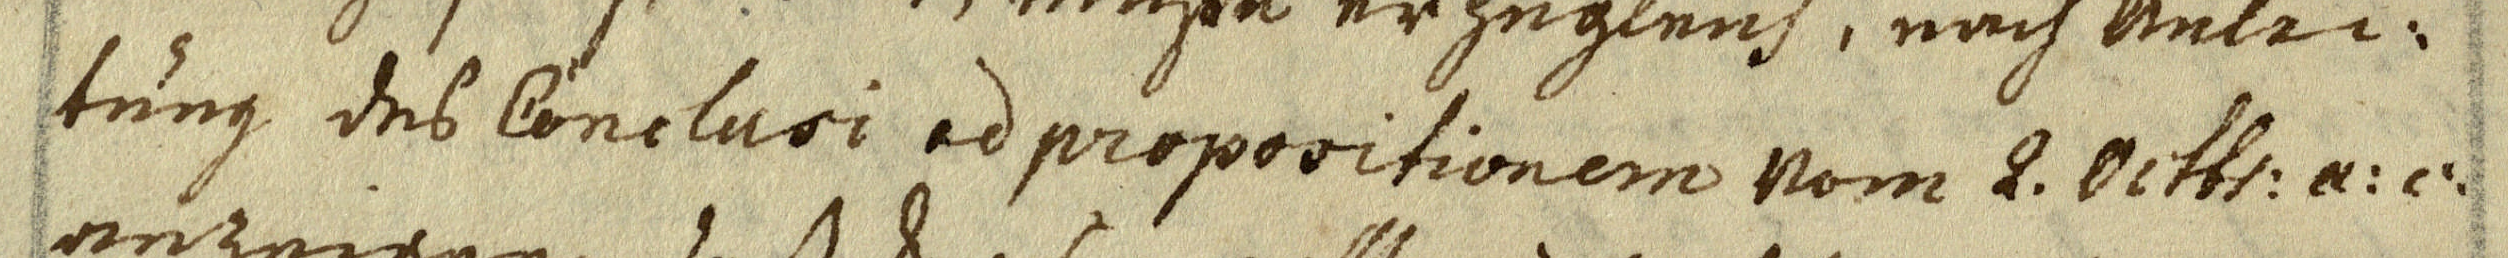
tung des Conclusi ad propositionem vom 2. Octbr. a. c.
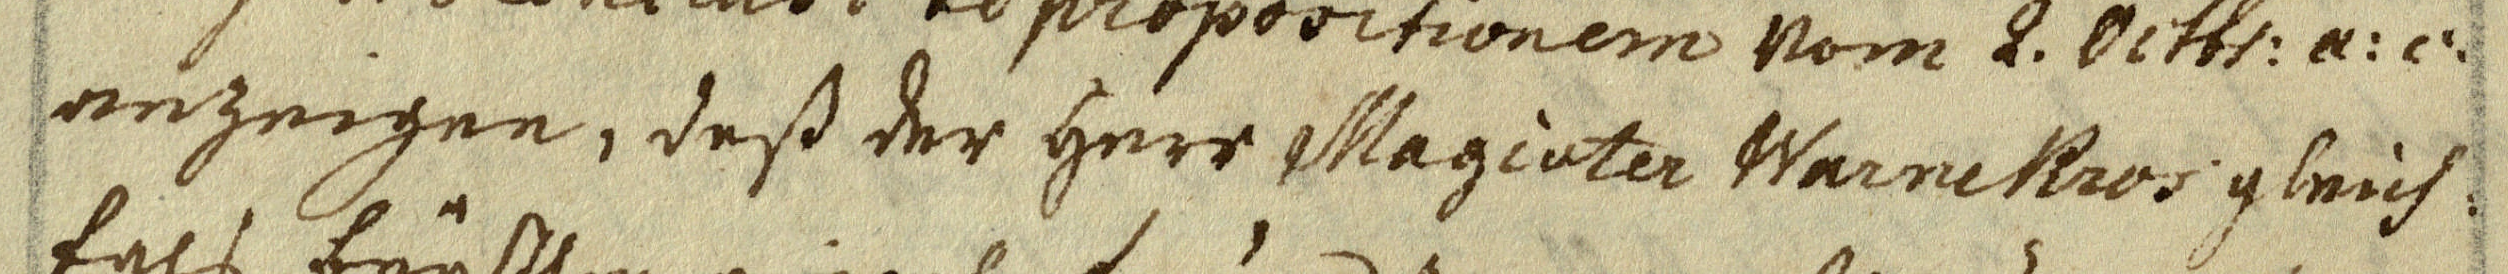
anzeigen, daß der Herr Magister Warnekros gleich¬
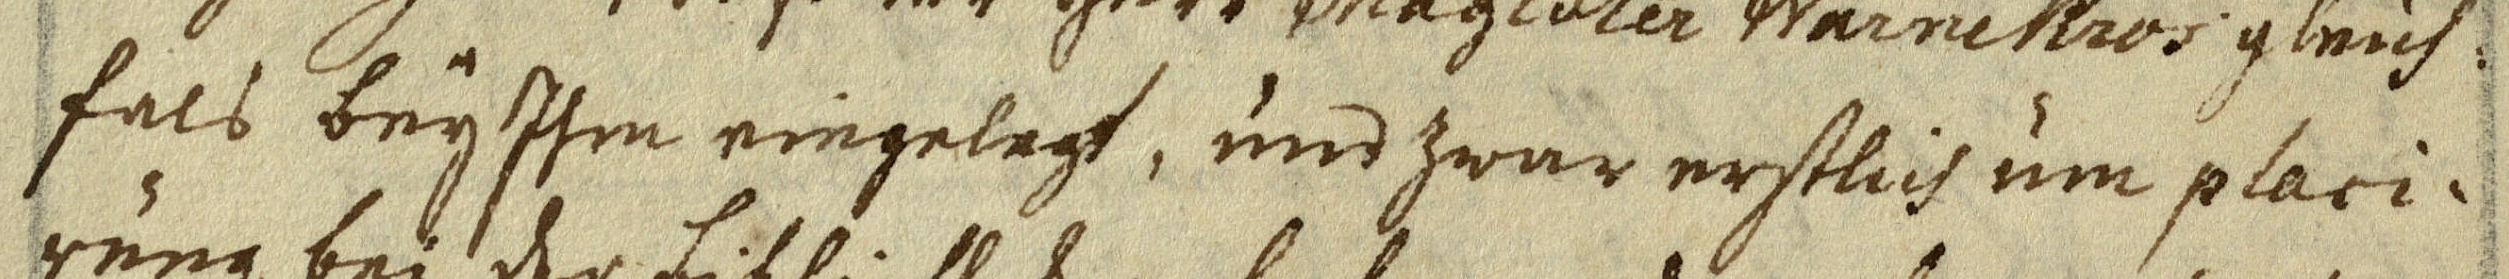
fals beÿ Ihm eingelegt, und zwar erstlich um placi¬
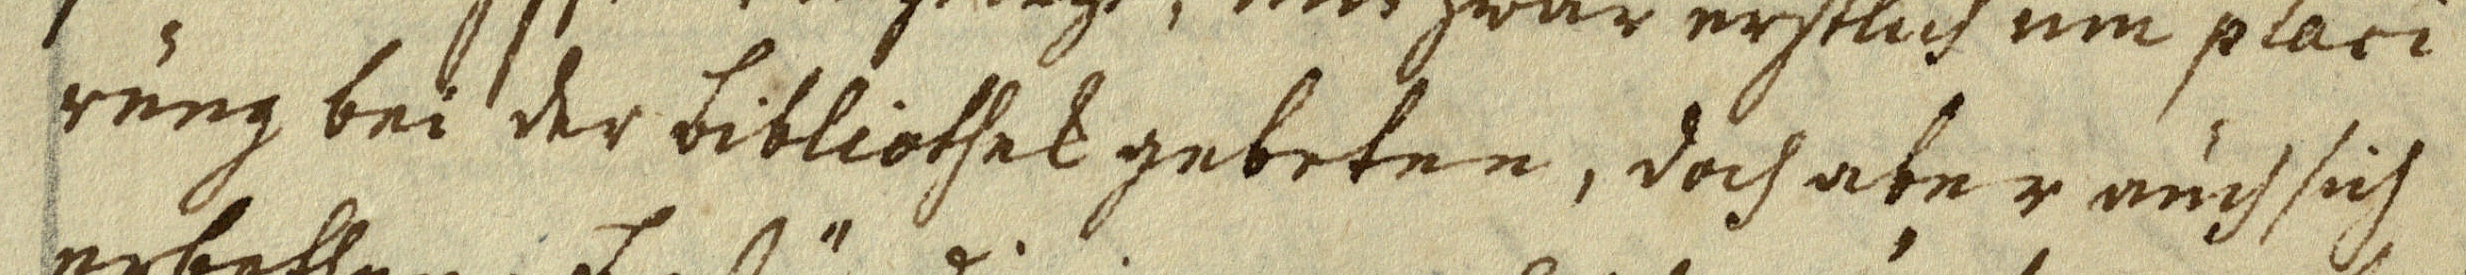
rung bei der Bibliothek gebeten, doch aber auch sich
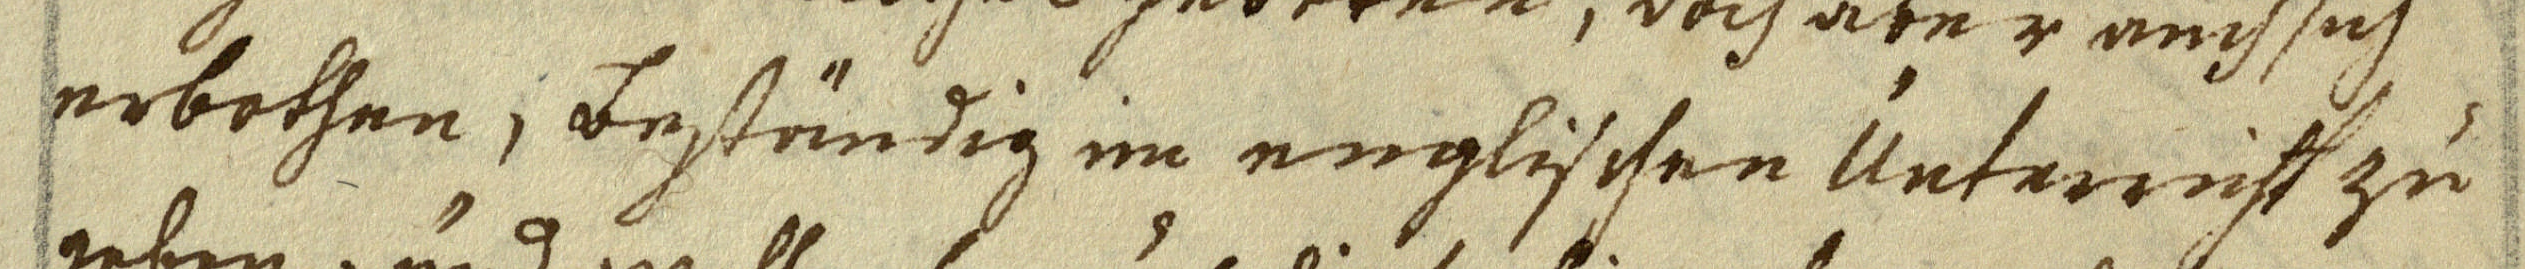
erbothen, beständig im englischen Unterricht zu
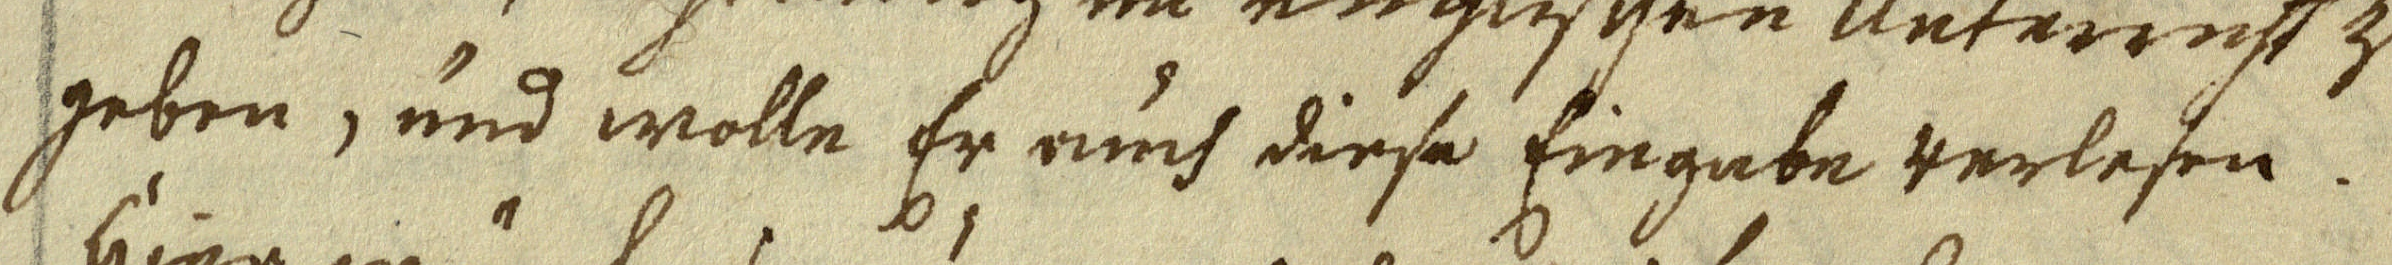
geben, und wolle Er auch diese Eingabe verlesen.
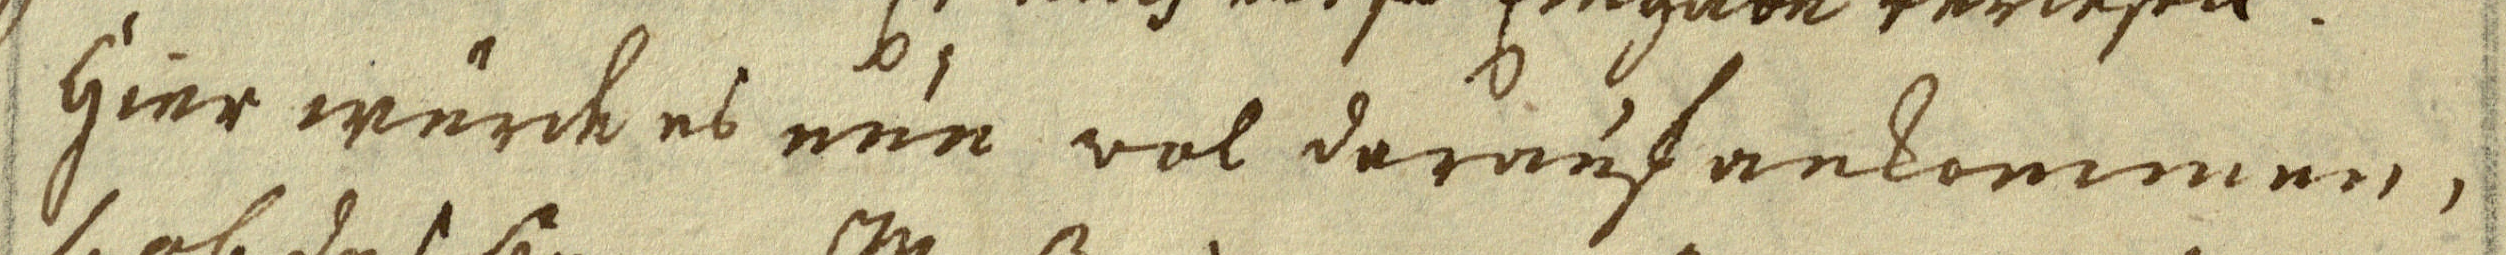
Hier würde es nun wol darauf ankommen,
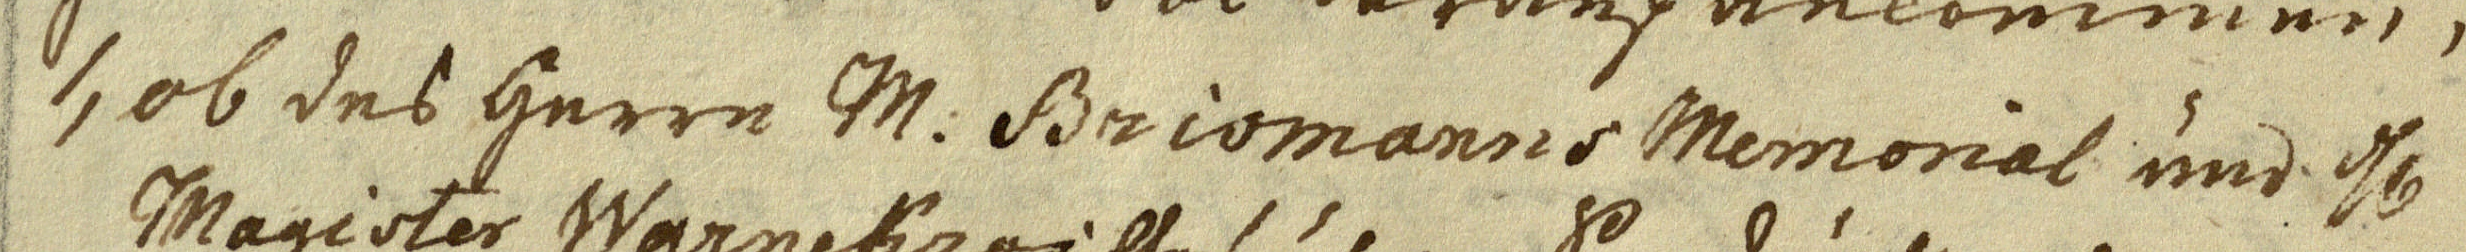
1, ob des Herrn M. Brismanns Memorial und dh
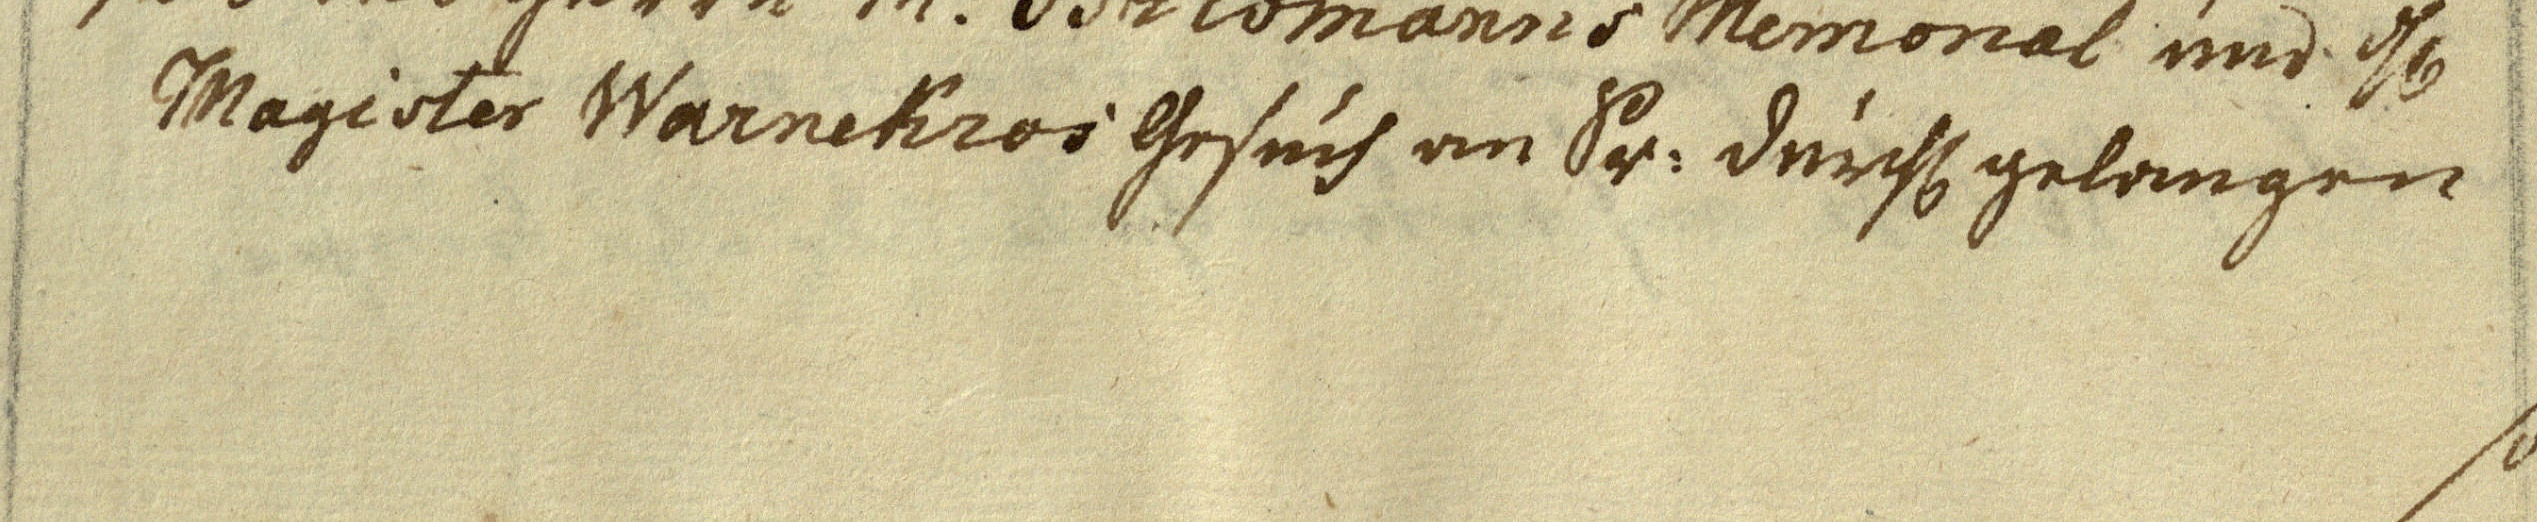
Magister Warnekros Gesuch an Sr Durchl. gelangen
